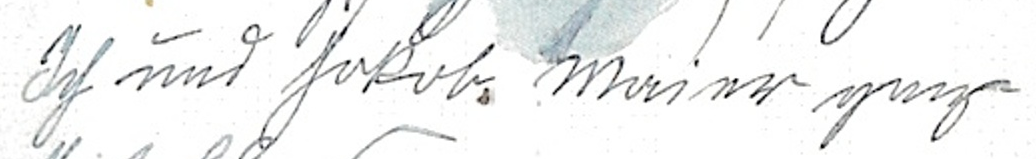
Ich und Jakob Maier ganz
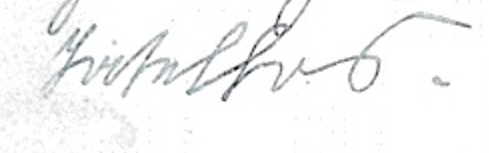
Jatellos.
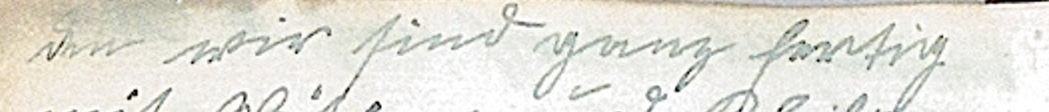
den wir sind ganz fertig
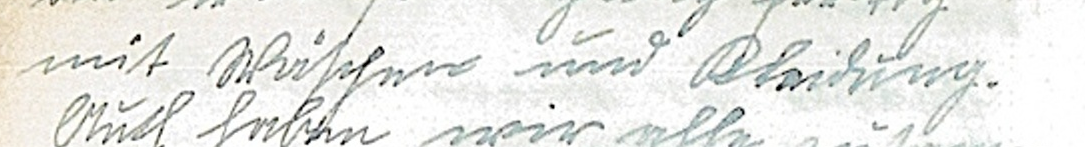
mit Wäschen und Kleidung
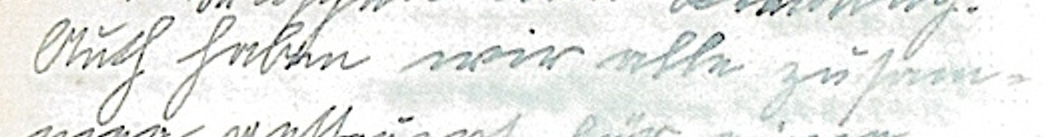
Auch haben wir alle zusam-
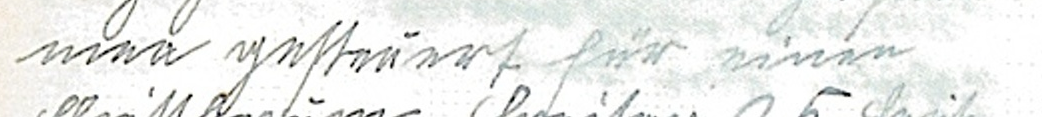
men gestimmt für einen
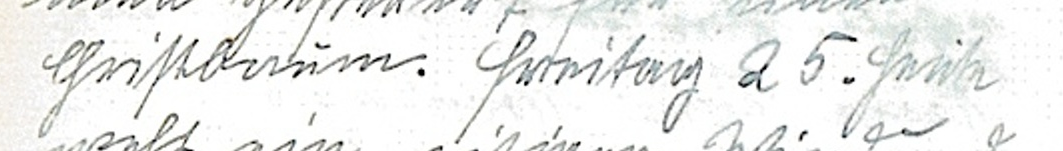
Christbaum. Freitag 25. Heute
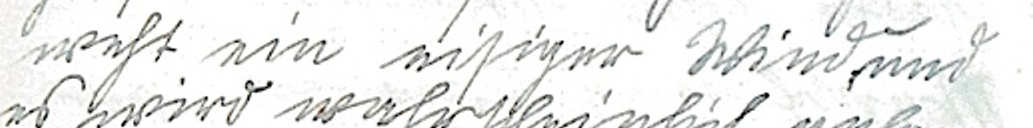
weht ein eisiger Wind und
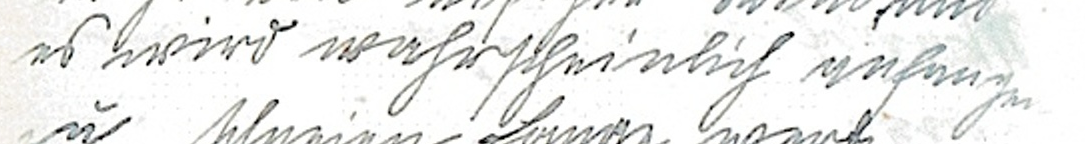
es wird wahrscheinlich anfangen
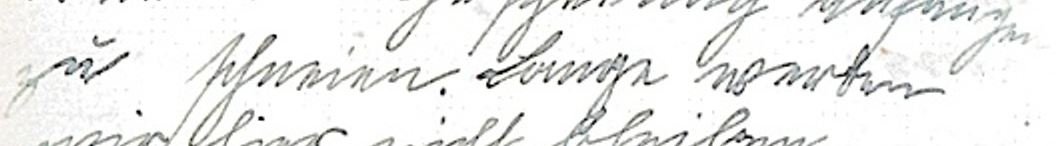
zu schneien. Lange werden
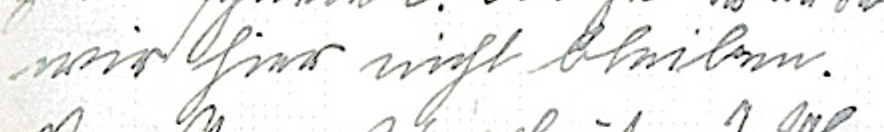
wir hier nicht bleiben.
